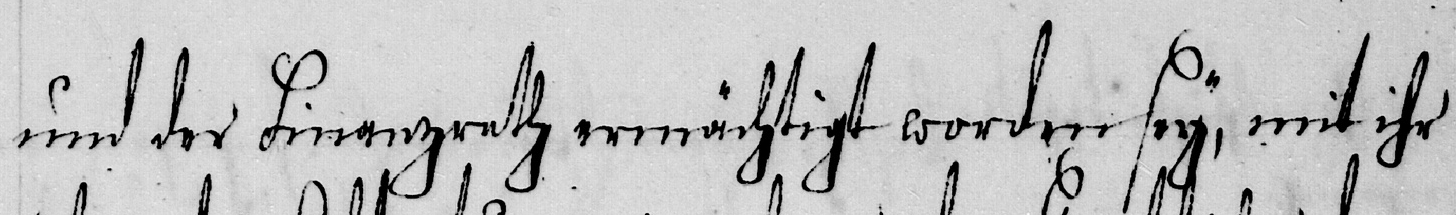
und der Finanzrath ermächtigt worden sey, mit ihr
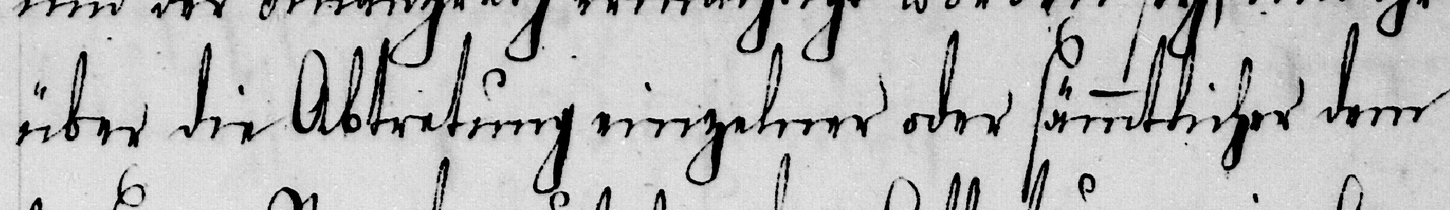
über die Abtretung einzelner oder sämmtlicher dem
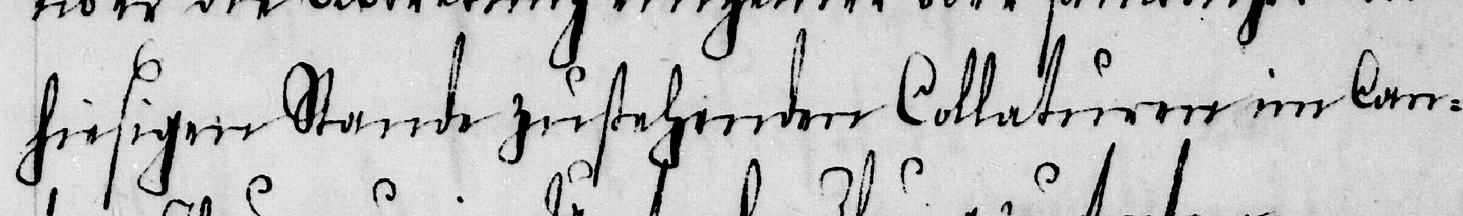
hiesigen Stande zustehenden Collaturen im Can¬
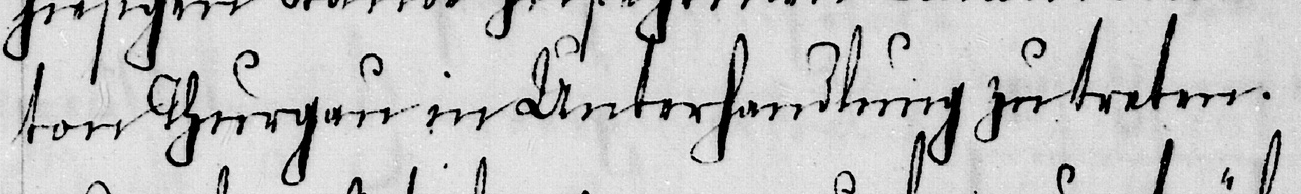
ton Thurgau in Unterhandlung zu treten.
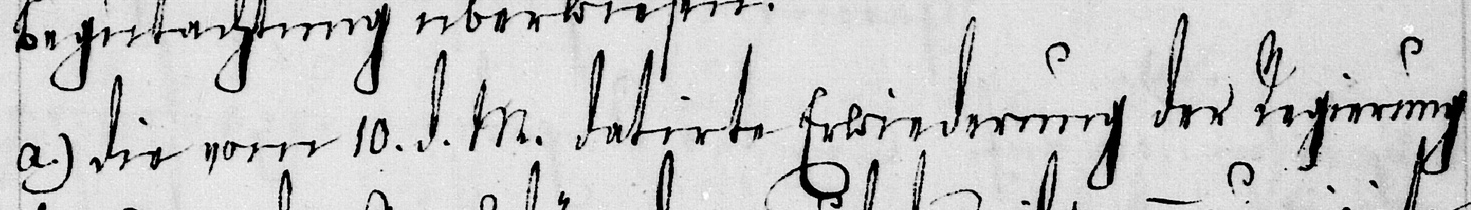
a.) die vom 10. d. M. datirte Erwiederung der Regierung
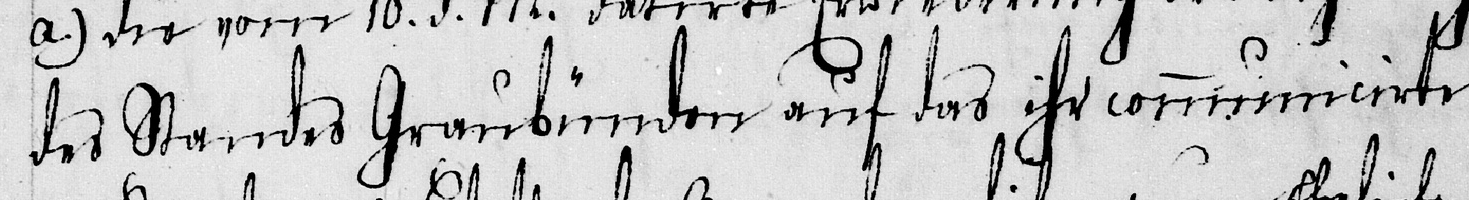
des Standes Graubünden auf das ihr communicirte
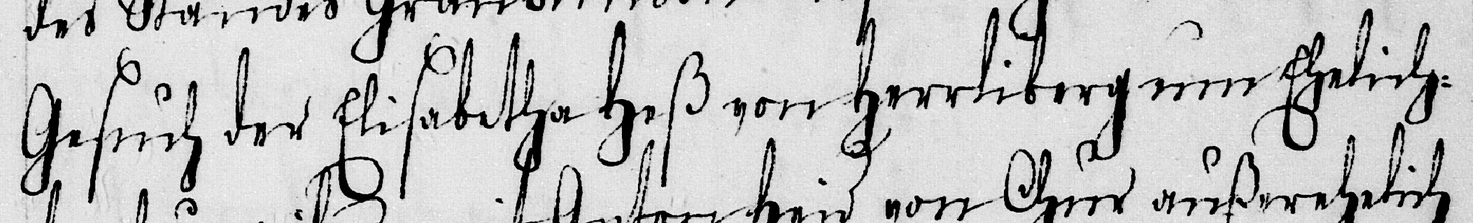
Gesuch der Elisabetha Heß von Herrliberg um Ehelich¬
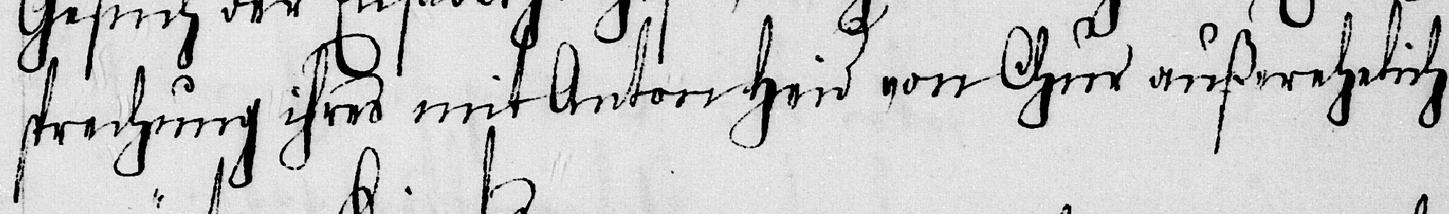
sprechung ihres mit Anton Heid von Chur außerehelich
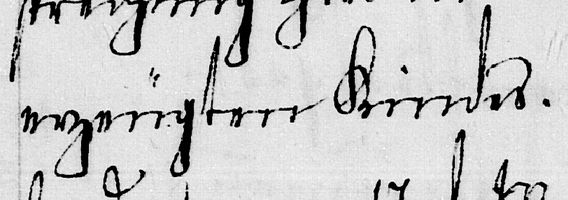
erzeugten Kindes.
